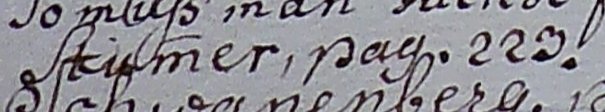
Stum̅er, pag. 223.
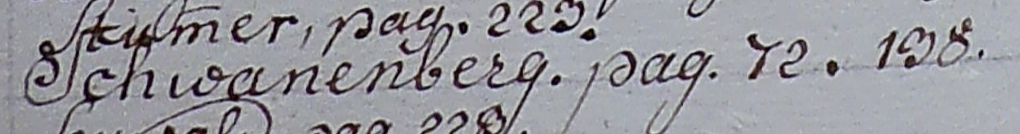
Schwanenberg. pag. 72. 138.
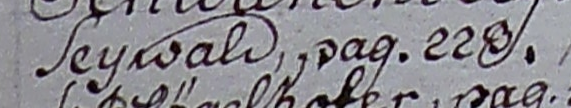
Seywald, pag. 223.
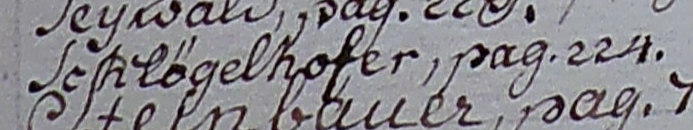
Schlögelhofer, pag. 224.
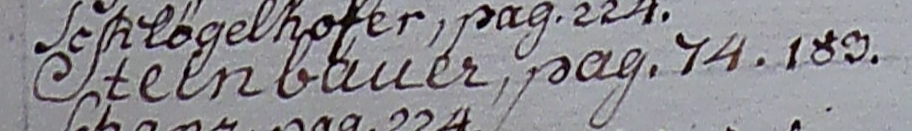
Steinbauer, pag. 74. 183.
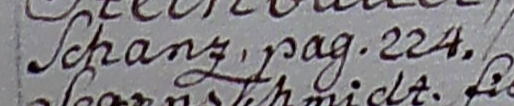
Schanz, pag. 224.
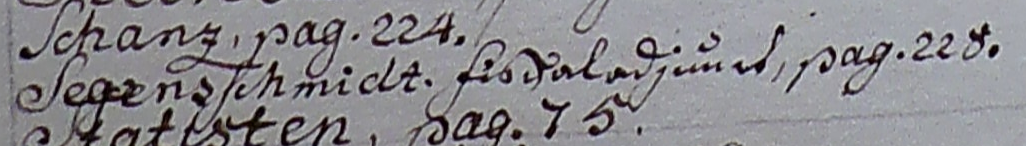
Segenschmidt. Fiscaladjunct, pag. 228.
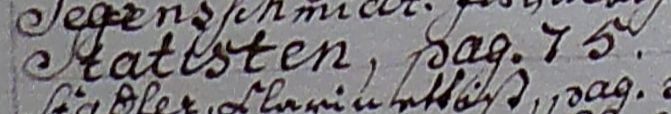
Statisten, pag. 75.
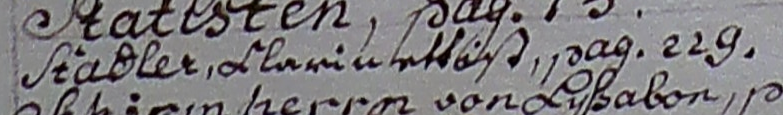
Stadler, Clarinettist, pag. 229.
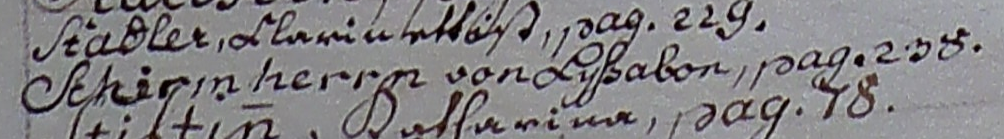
Schirmherrn von Lissabon, pag. 238.
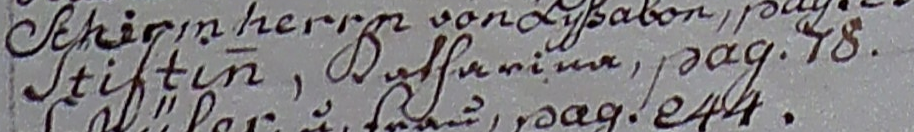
Stiftin̅, Katharina, pag. 78.
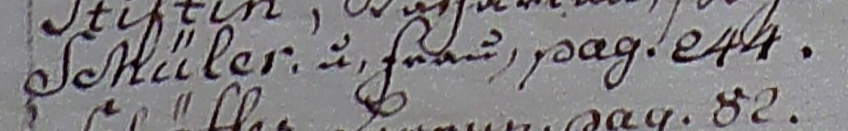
Schüler. u, Frau, pag. 244.
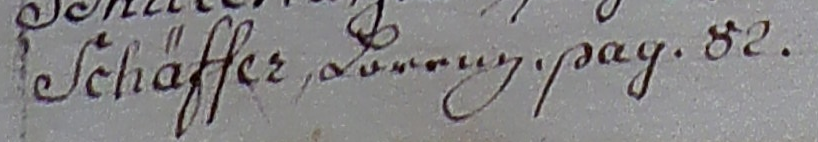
Schäffer, Lorenz, pag. 82.
